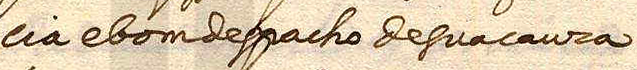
cia e bom despacho de sua cauza
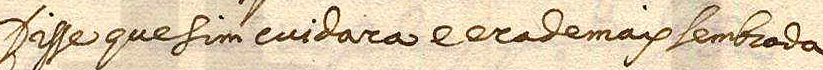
Disse que sim cuidara e era de mais lembrada
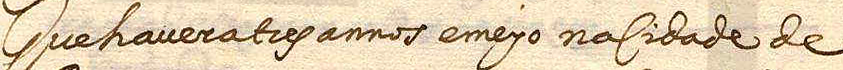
Que hauera tres annos e meyo na Cidade de
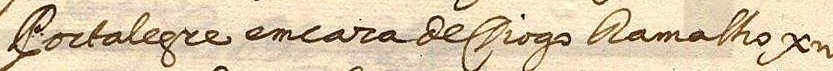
Portalegre em caza de Diogo Ramalho xn
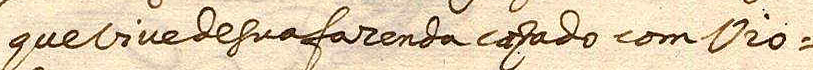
que viue de sua fazenda cazado com Vio
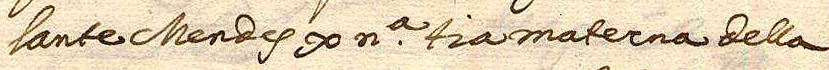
lante Mendes xn.a tia materna della
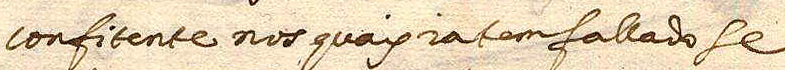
confitente nos quais ia tem fallado se
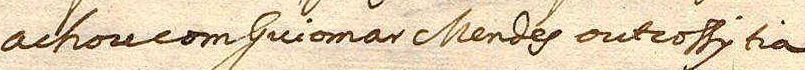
achou com Guiomar Mendes outrossy tia
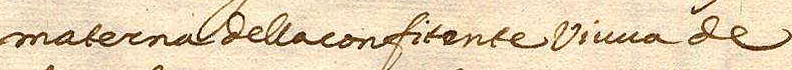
materna della confitente viuua de
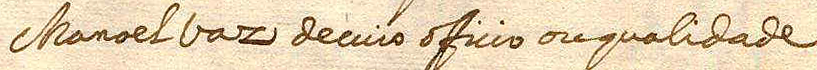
Manoel Vaz de cuio officio ou qualidade
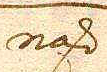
naõ
